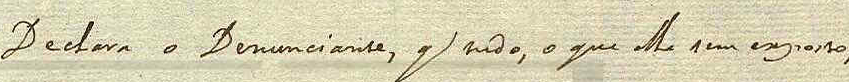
Declara o Denunciante, q̄ tudo, o que elle tem exposto,
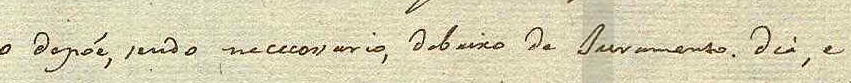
o depõe, sendo neccessario, debaixo de Iuramento. dia, e
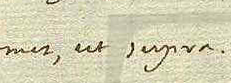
mes, ut supra.
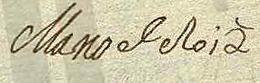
Manoel Roiz̄
